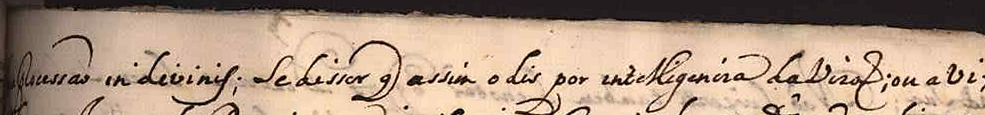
pRocessaõ in divinis; Se disser q̄ assim o dis por intelligencia da Vizaõ, ou a vi
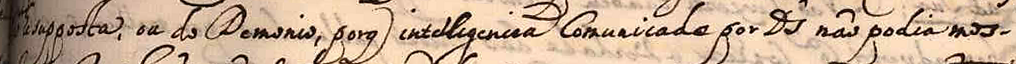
he supposta, ou do Demonio, porq̄ intelligencia Comunicada por Ds̄ naõ podia mos
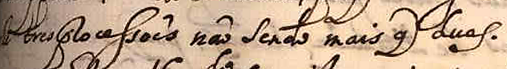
tres pRocessoẽs não sendo mais q̄ duas.
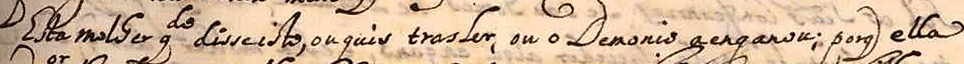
Esta molher qdo disse isto, ou quis trasler, ou o Demonio a enganou; porq̄ ella
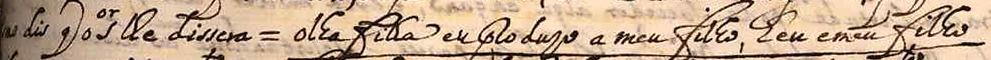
dis q̄ o sor lhe dissera = olha filha eu pRoduzo a meu filho, E eu e meu filho
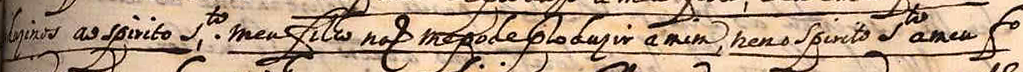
duzimos ao spirito s.to meu filho naõ me pode pRoduzir a mim, nem o Spirito S.to a meu fo
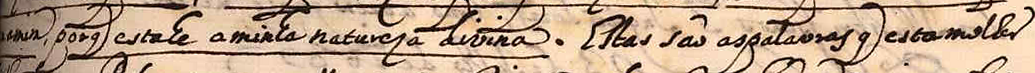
a mim, porq̄ esta he a minha natureza divina. Estas saõ as palavras q̄ esta molher
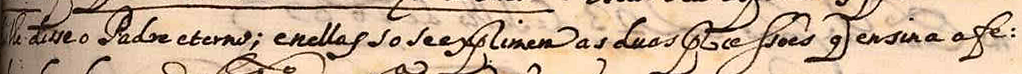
lhe disse o Padre eterno; e nellas so se expRimem as duas processoẽs q̄ ensina a fe:
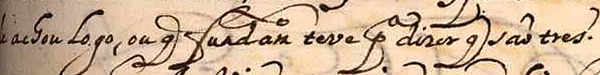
achou logo, ou q̄ fundamto teve p.a dizer q̄ saõ tres?
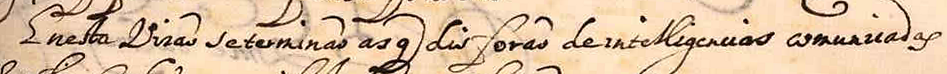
E nesta Vizaõ se terminaõ as q̄ dis foraõ de intelligencias comunicadas
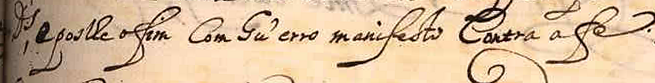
Ds̄, e poslhe o fim com hū erro manifesto Contra a fe.
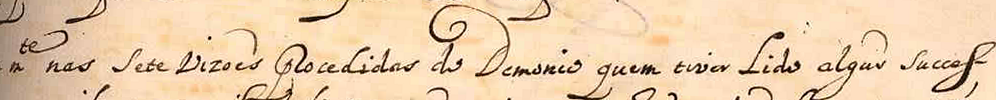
mte nas sete vizoẽs procedidas do Demonio quem tiver lido algūs succes
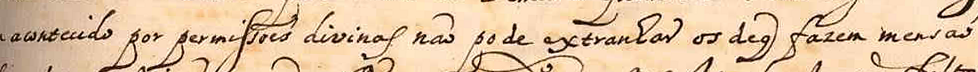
acontecido por permissoẽs divinas não pode extranhar os de q̄ fazem mensaõ
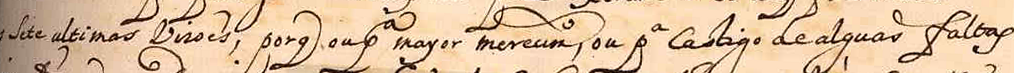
Sete ultimas Vizoẽs, porq̄ ou p.a mayor merecimto, ou p.a castigo de alguās faltas
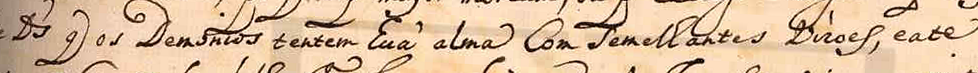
Ds̄ q̄ os Demonios tentem huā alma Com semelhantes Vizões, e ate
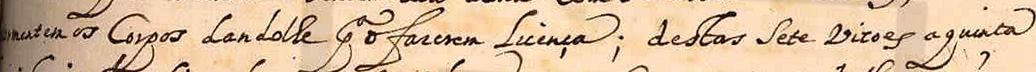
mentem os Corpos dandolhe p.a o fazerem Licença; destas Sete Vizoes a quinta
